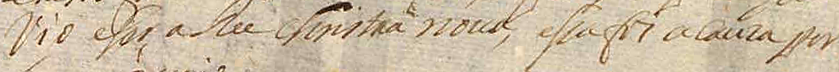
Vio e fez a Ree christaã noua, essa foi a cauza por
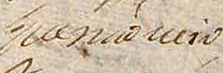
que não ueio
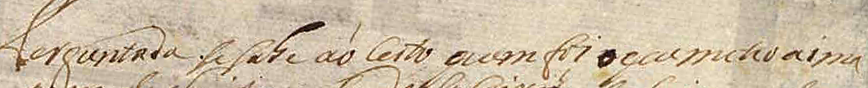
Perguntada se sabe ao certo quem foi o que meteo a ima
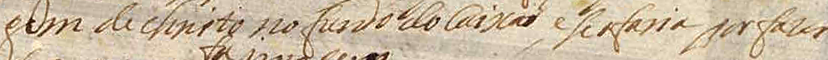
gem de christo no fundo do caixão, e se o faria por fazer
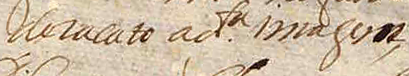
dezacato a d̄.a imagem,
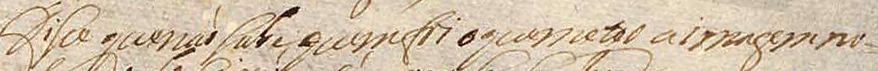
Disse que naõ sabe, quem foi o que meteo a imagem no
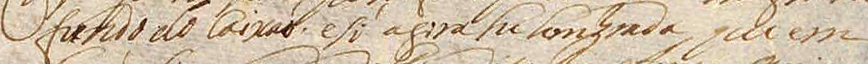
fundo do caixaõ e si agora he lembrada, que em
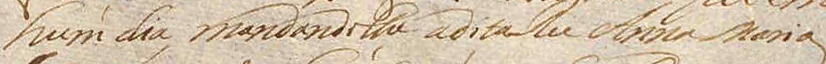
hum dia, mandandolhe a dita Ree Anna Maria
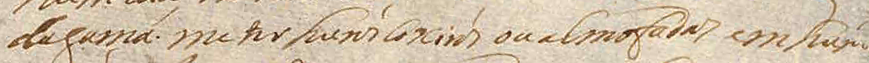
da gama meter huns coxins ou almofadas em hum̄
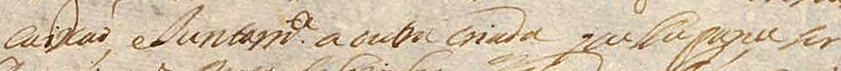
caixaõ, e Iuntam.te a outra criada que lhe pareçe ser
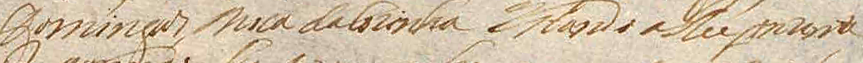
Domingas Moça da cozinha Estando a Ree prezente
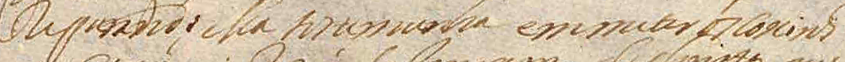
Reparando ella testemunha em meter os coxins
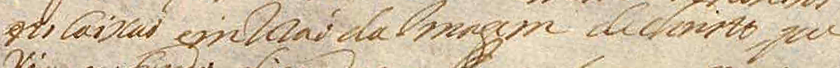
no caixaõ em Rezaõ da Imagem de christo, que
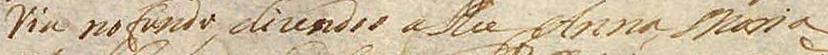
viu no fundo, dizendoo a Ree Anna Maria
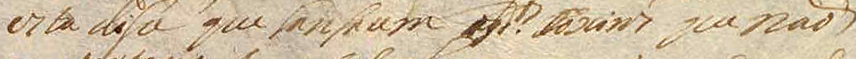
esta disse que lansacem os d.os coxins que naõ
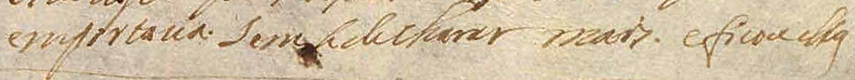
emportaua sem se declarar mais. e ficou ella
